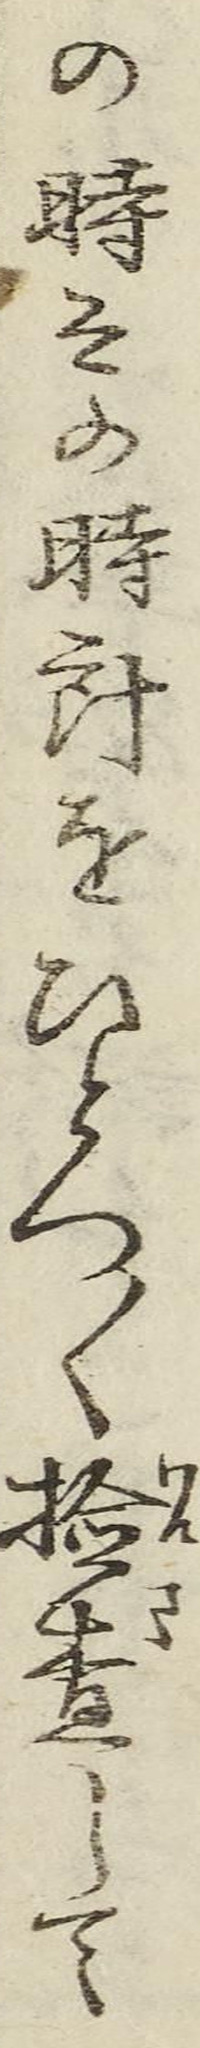の時その時計をひとつ〳〵検査して

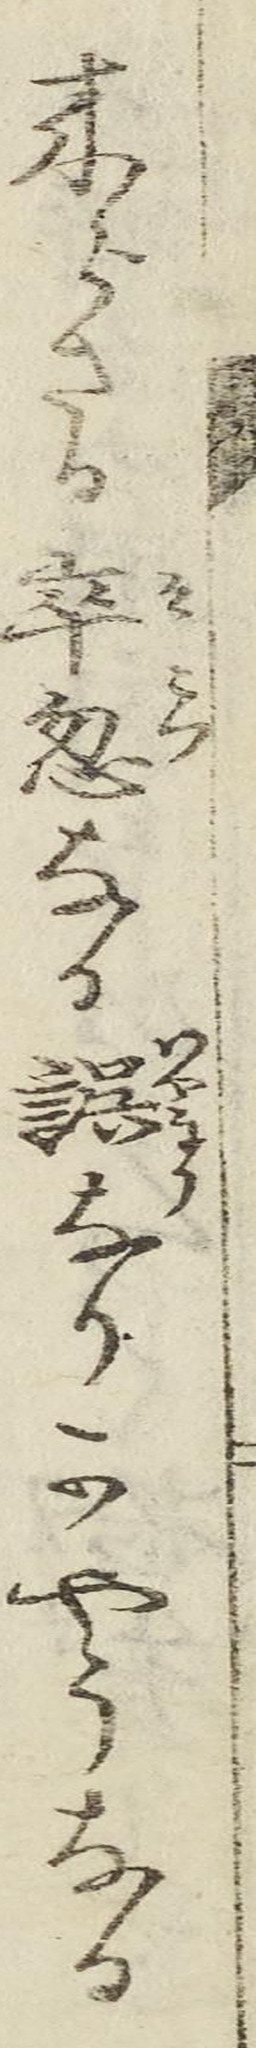来らさる卒忽なる誤なりかやうなる
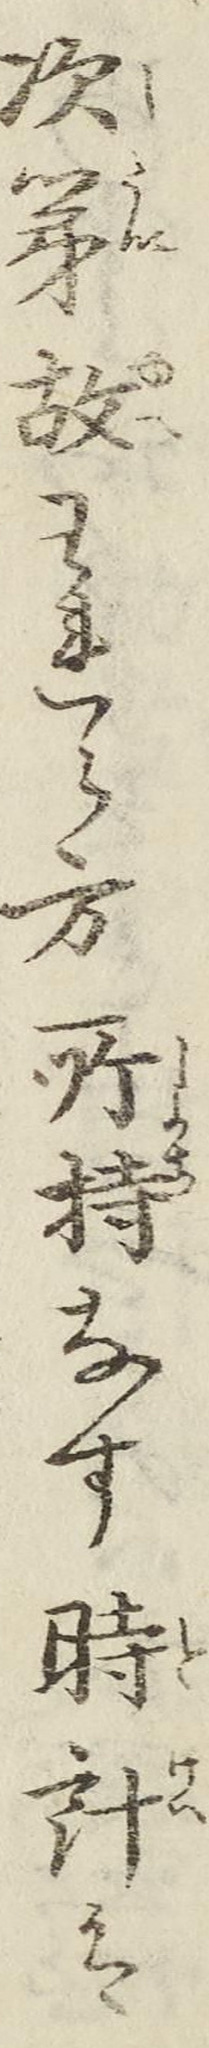次第故われら方所持なす時計は
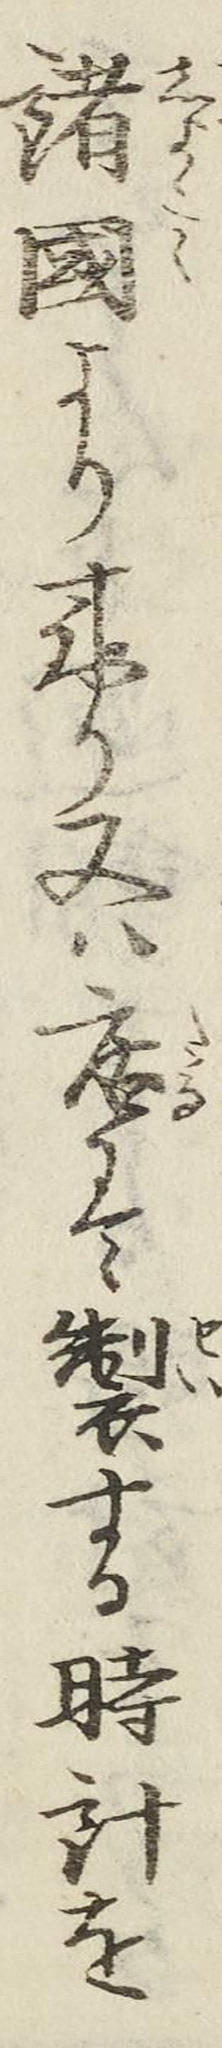諸国より来り又は店にて製する時計を
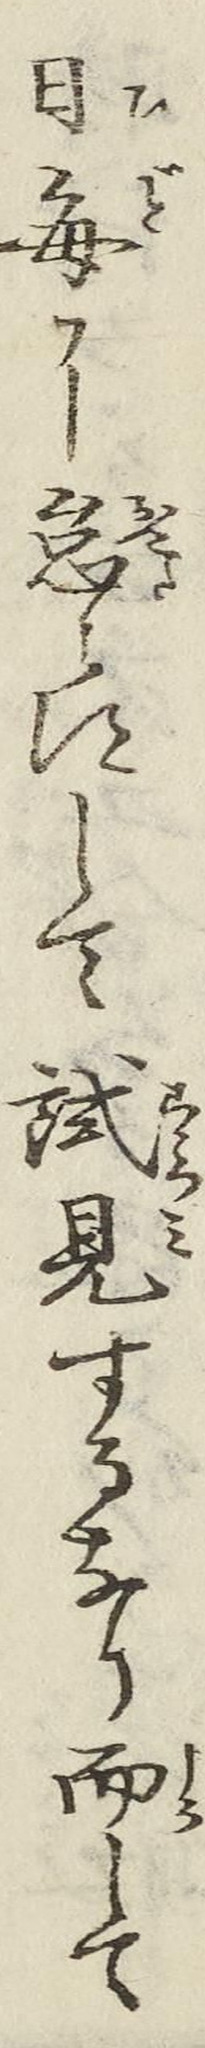日毎に怠らすして試見するなり而して
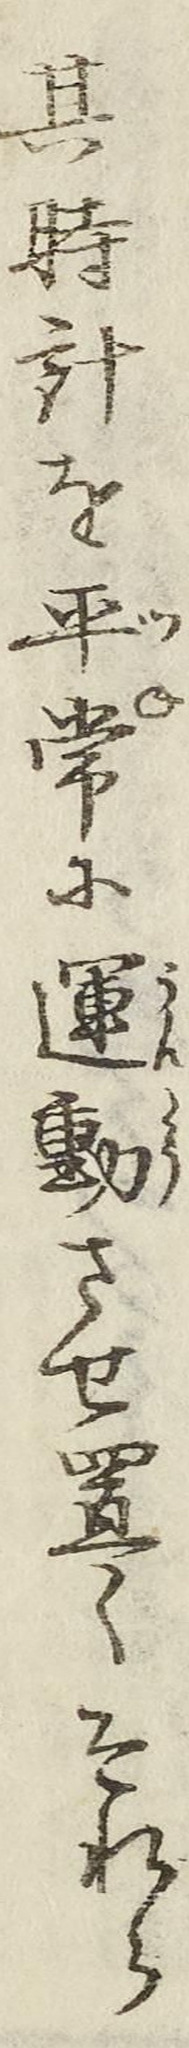其時計を平常に運動させ置くそれら
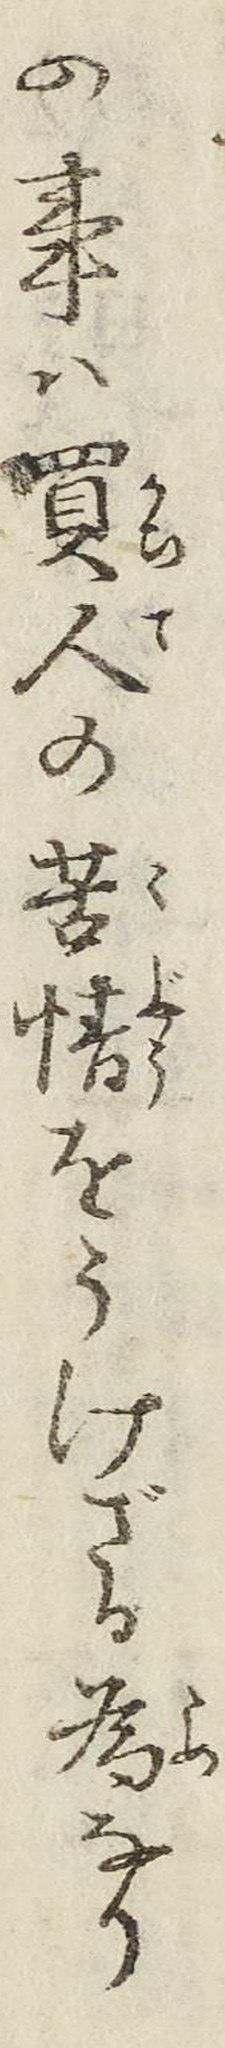の事は買人の苦情をうけざる為なり
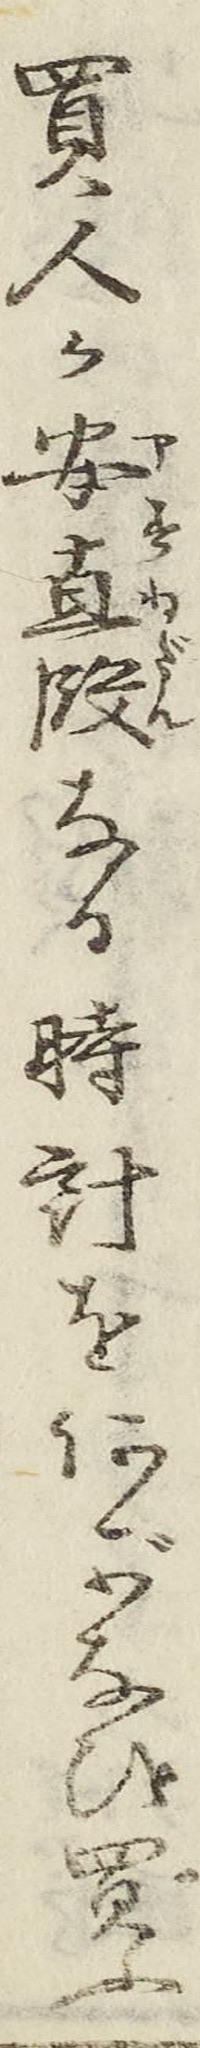買人か安直段なる時計をあがなひ買ふ
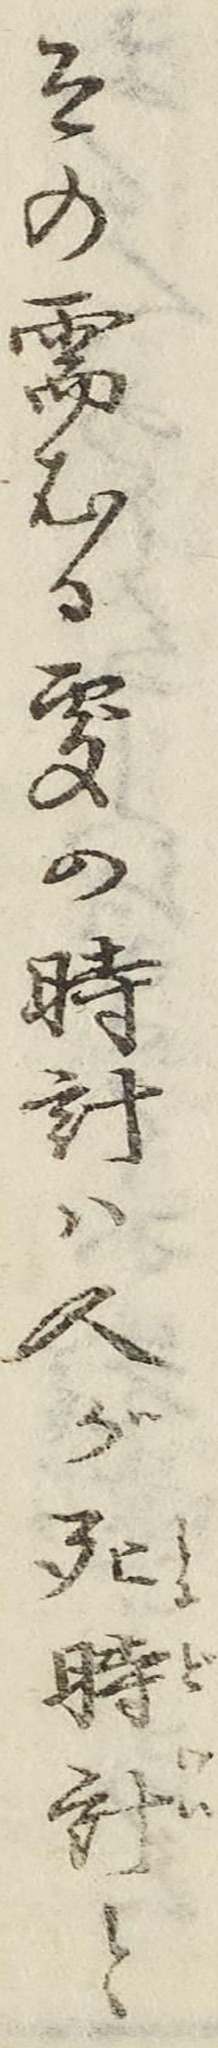その需むる処の時計は人が死時計と
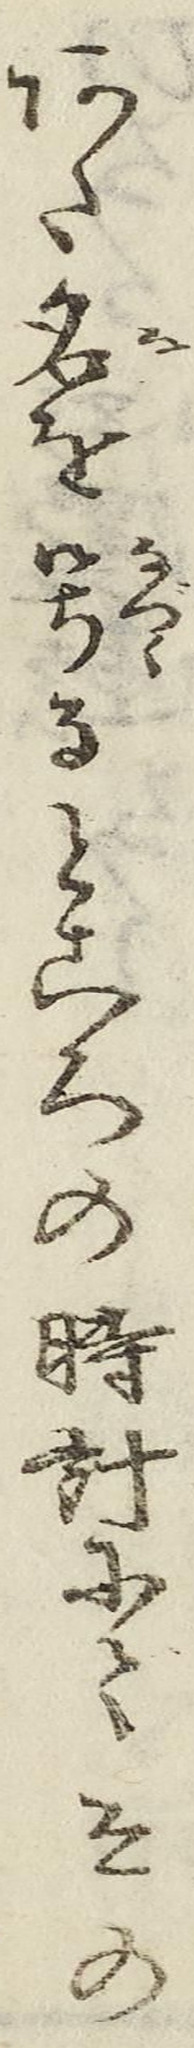あた名を号るところの時計にてその
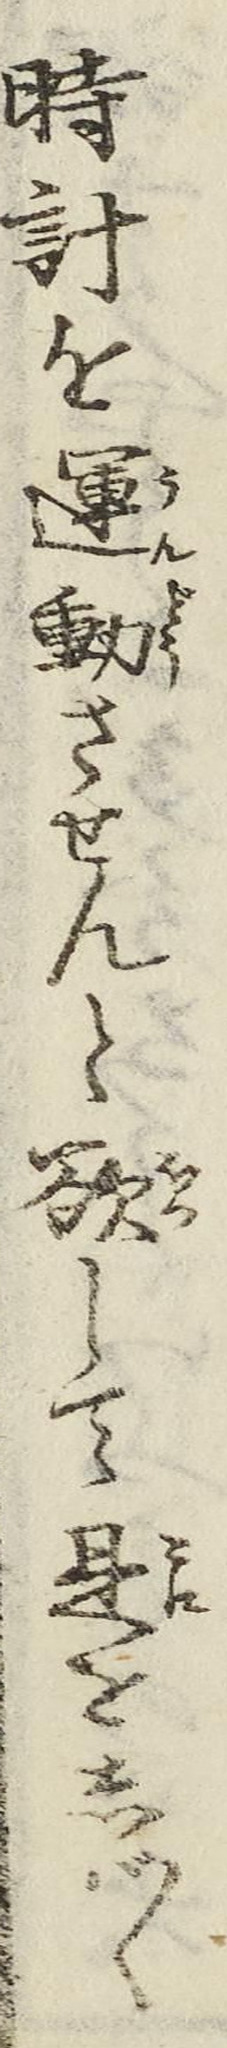時計を運動させんと欲して是をしば〳〵
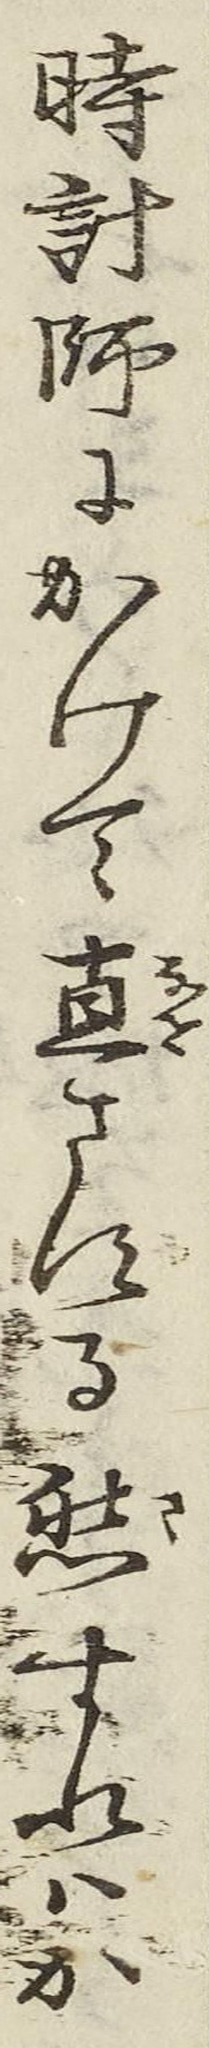時計師にかけて直さする然すれはか
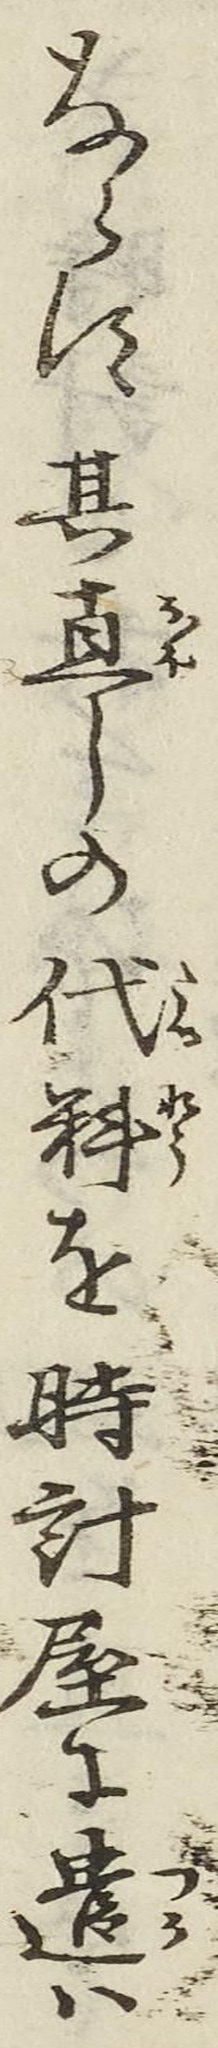ならす其直しの代料を時計屋に遣は
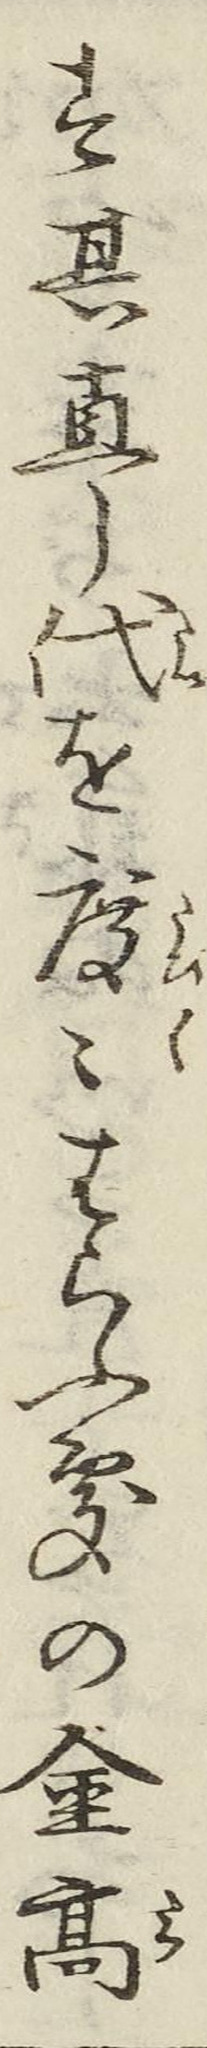す其直し代を度〻はらふ処の金高
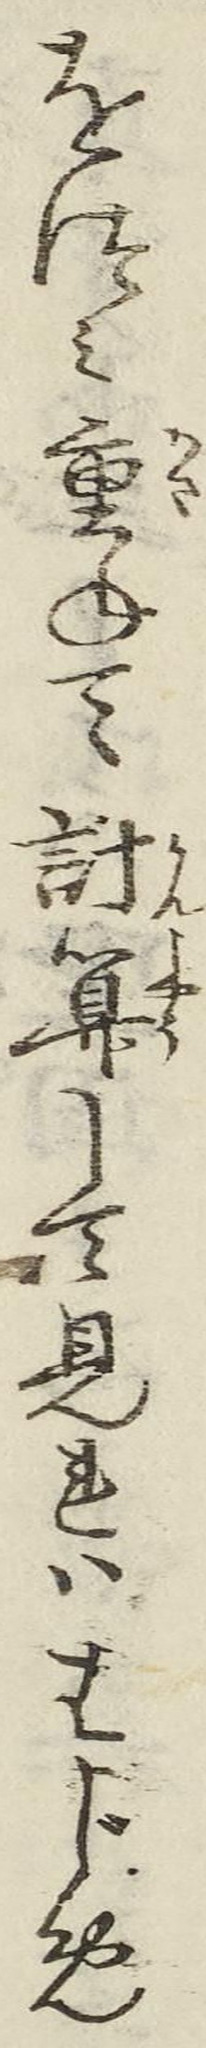をつみ重ねて計算して見れははじめ
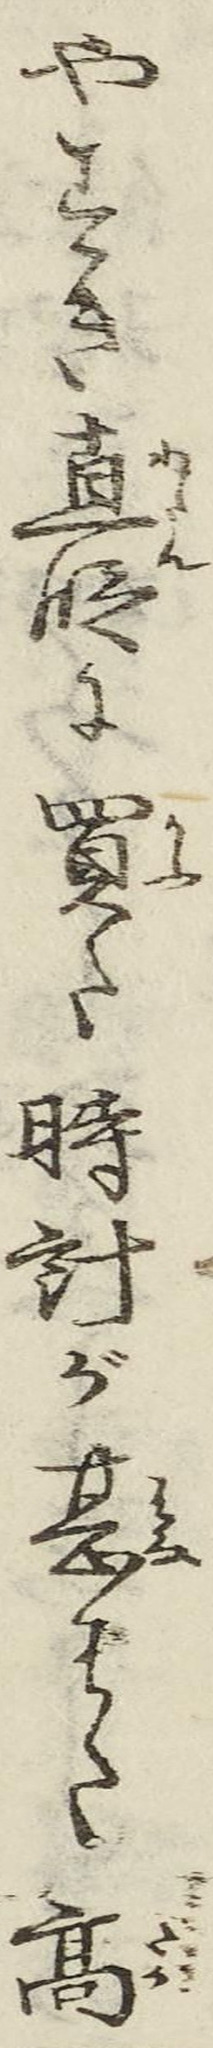やすき直段に買た時計が甚はた高
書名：[時計に関する冊子]
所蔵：東京大学地震研究所図書室 Earthquake Research Institute Library, The University of Tokyo, JAPAN
